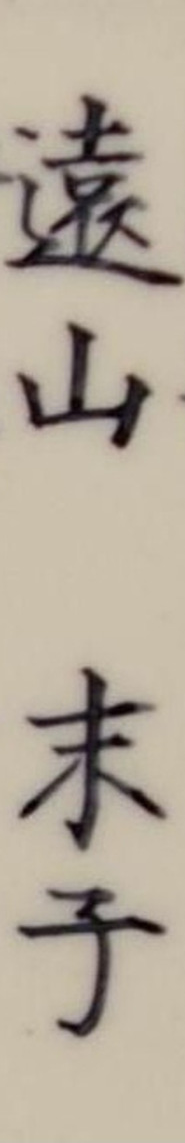遠山末子
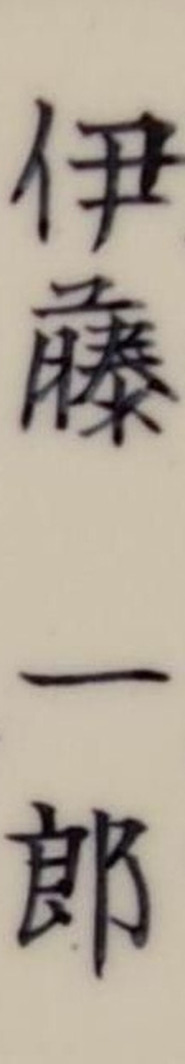伊藤一郎
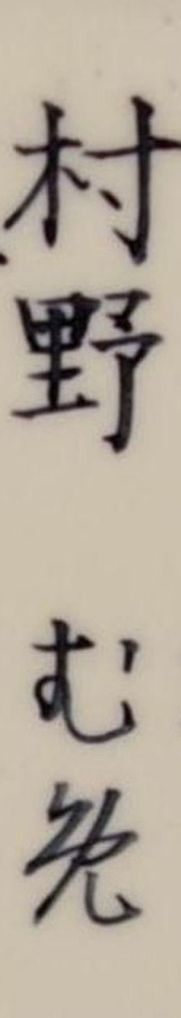村野むめ
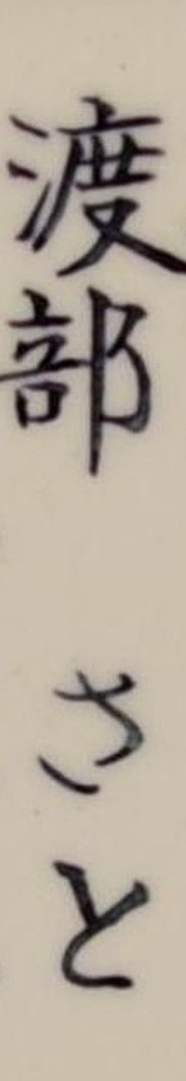渡部さと
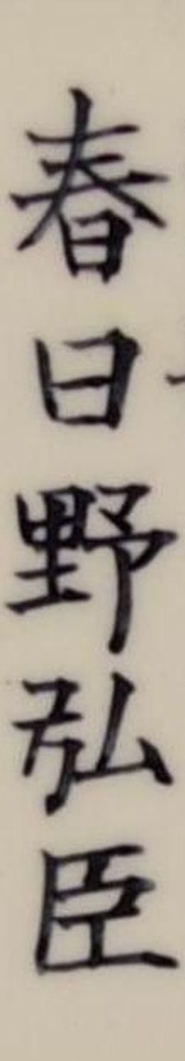春日野弘臣
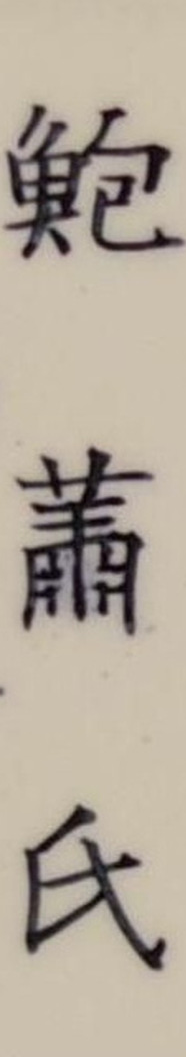鮑蕭氏
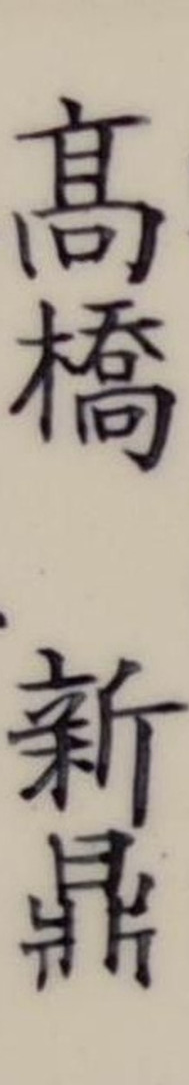高橋新鼎
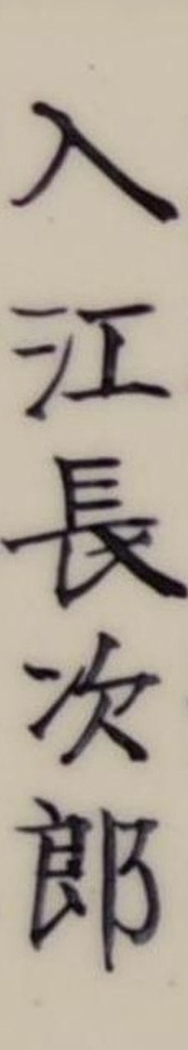入江長次郎
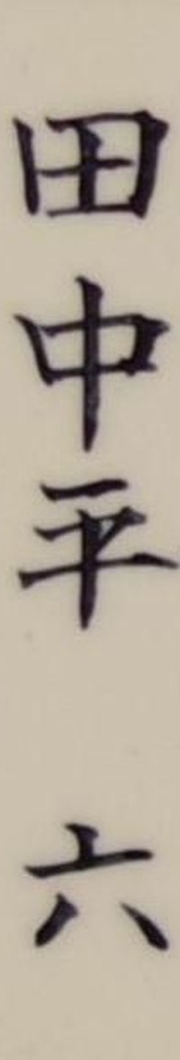田中平六
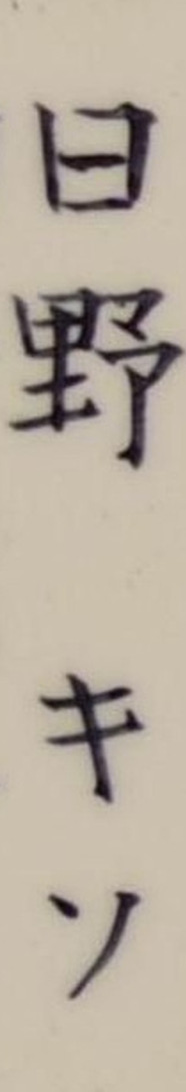日野キソ
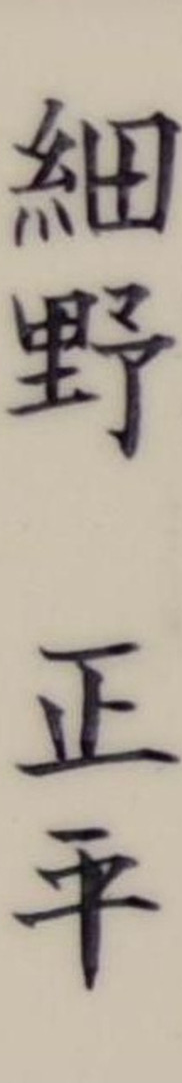細野正平
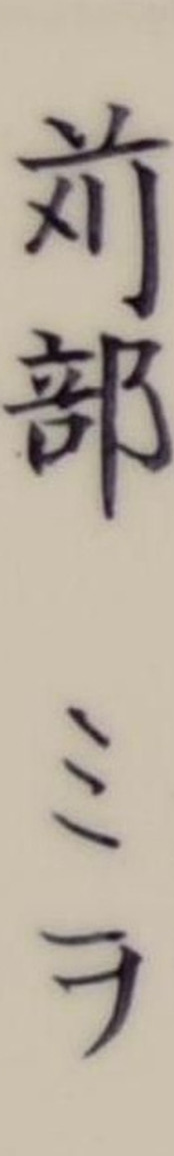苅部ミヲ
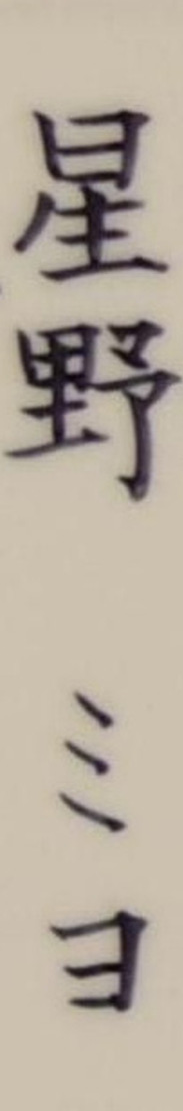星野ミヨ
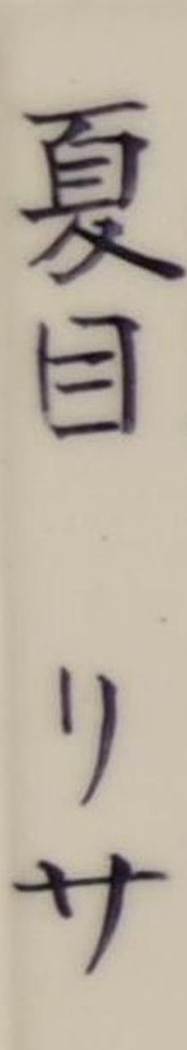夏目リサ

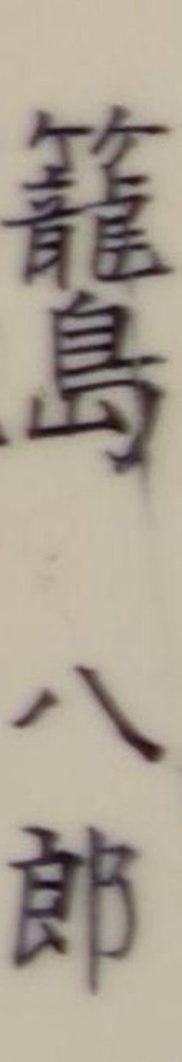籠島八郎
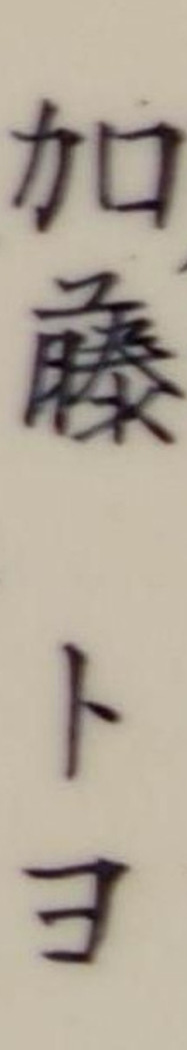加藤トヨ
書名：M~S
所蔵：高野山金剛峯寺
